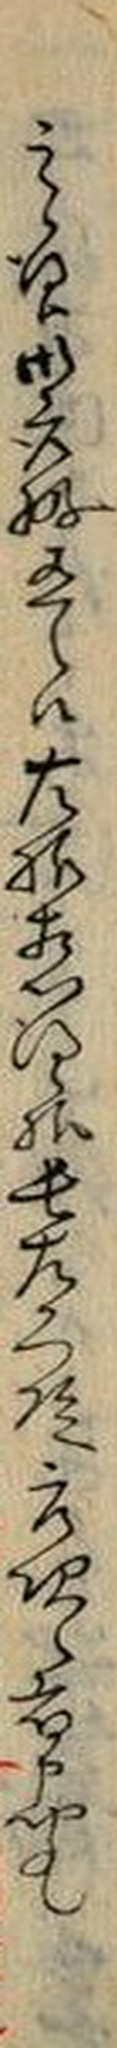之候得ハ御取扱有之候左様相心得候様長左衛門殿取次候者申聞候
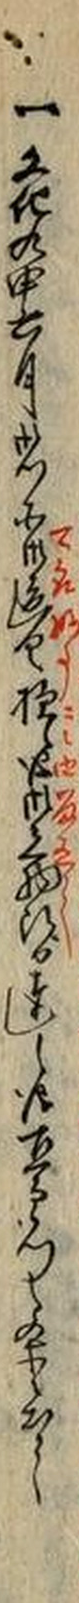一文化九申六月御門所御道具損候儀御先物頭ゟ達候儀下馬御門之条ニ出之
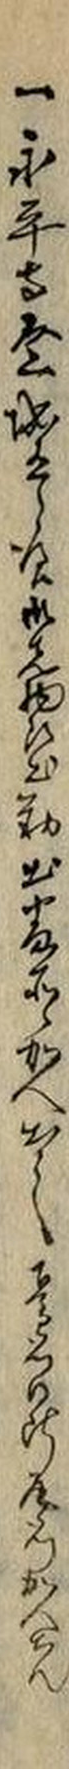一永平寺登城有之候得ハ御先物頭出勤出番所へ加人出之下馬御門同断瓦御門加人出候
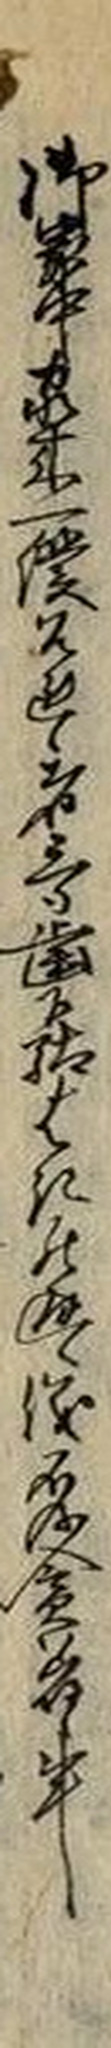御家中家来一僕召連候者三ツ歯下駄はき罷通候儀不及貪着事
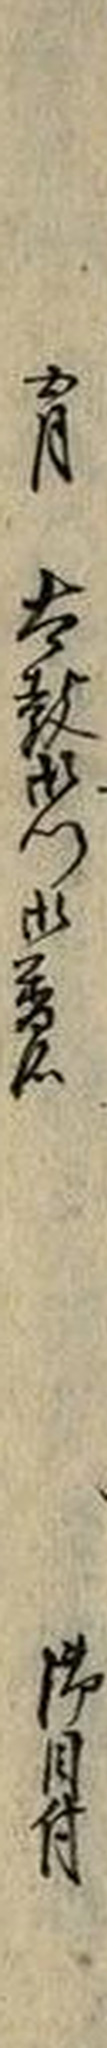五月太鼓御門御番所御目付
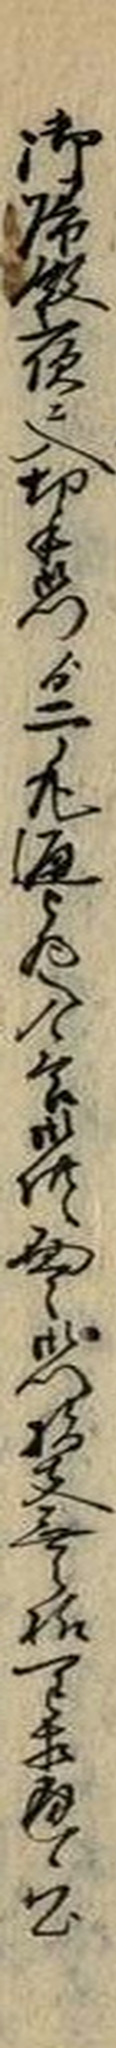御帰殿夜ニ入切手御門ゟ二ノ丸通被為入候節御供之面々御門差支無之候様可被相通候以上
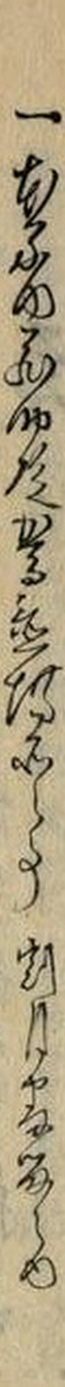一本多内蔵助殿駕置場所之事割月番留之内
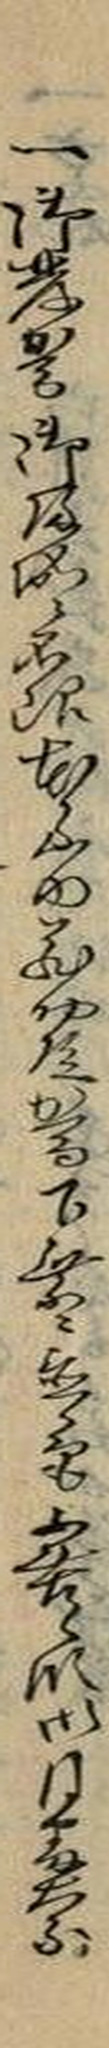一御発駕御帰城ニ不限本多内蔵助殿駕下乗ニ置候而も不苦候段御月番奈
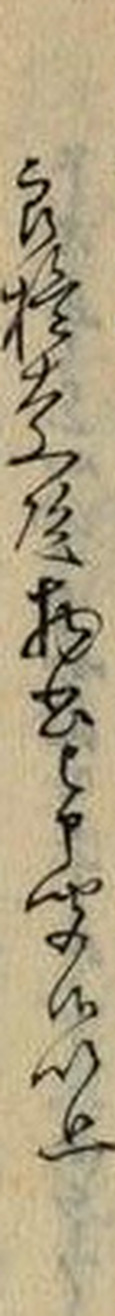良権太夫殿相書被申聞候以上
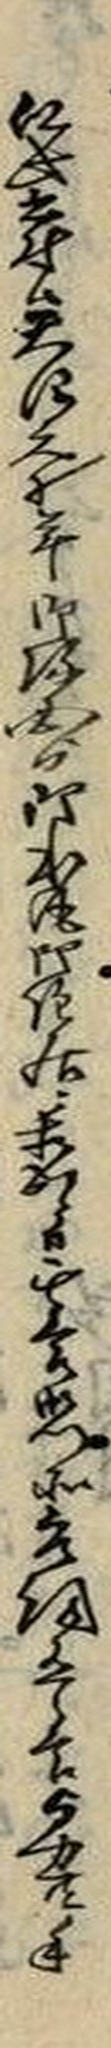但此書付ハ天保元寅年御帰国ゟ御本丸御住居ニ相成候付其節御門所取調有之節与力共手
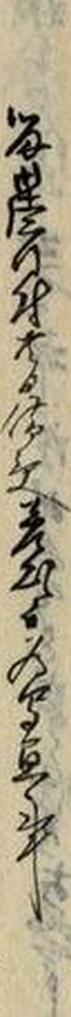留御徒目付共ゟ借受差出候ニ付為写置候事
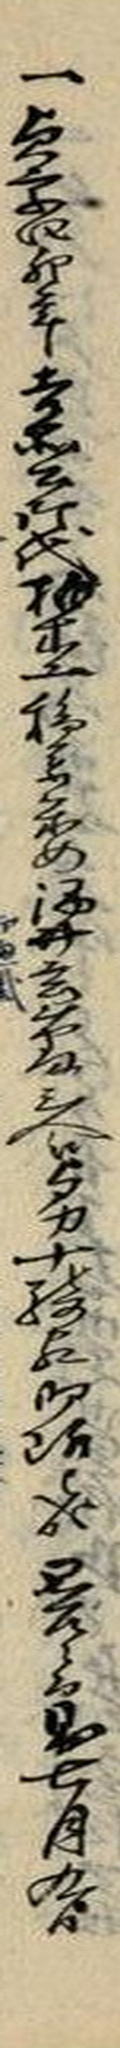一貞享四卯年吉品公御代狛杢稲葉采女酒井玄蕃三人江与力十騎宛御附被成思召ニ而則七月九日ゟ
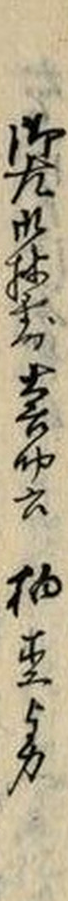御左御披露大谷助六狛木工与力
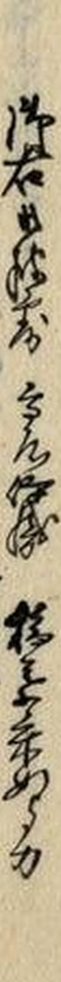御右披露高屋伊織稲葉采女与力
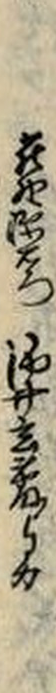同荻野孫右衛門酒井玄蕃与力
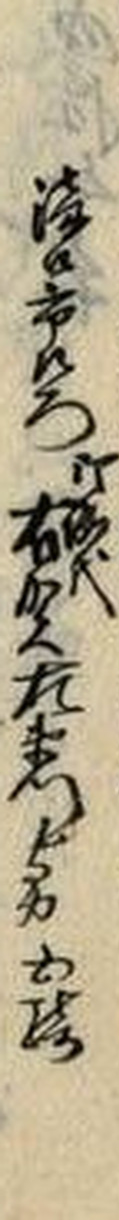溝口市左衛門御城代有賀左衛門与力五騎
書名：御門御櫓之部
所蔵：福井県文書館 Fukui Prefectural Archives
